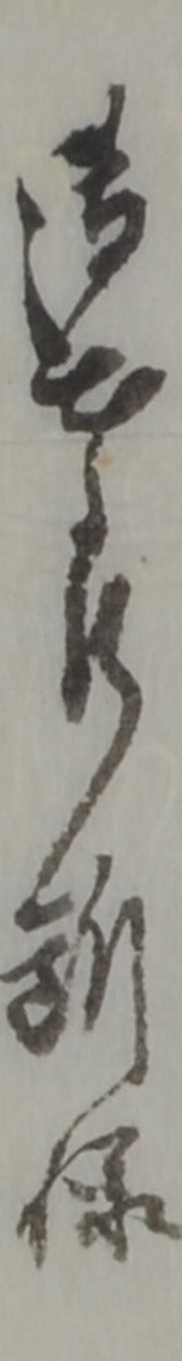御奉行所様
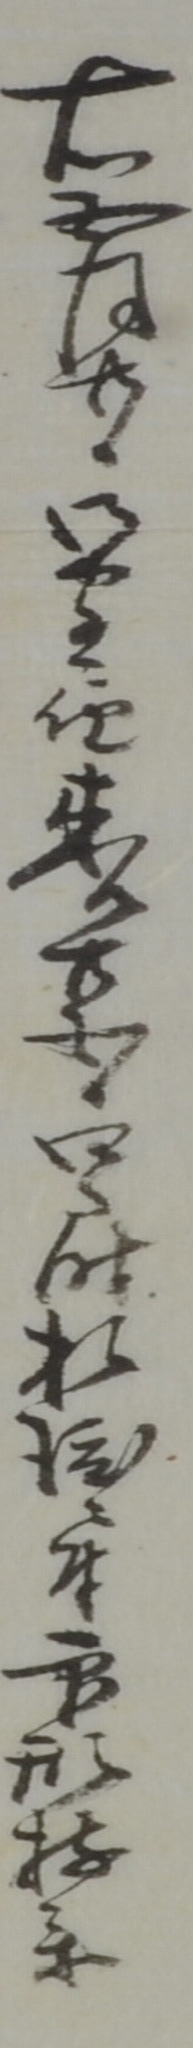右五月廿日御聞届来ル廿五日四つ時相渡ニ付印形持参
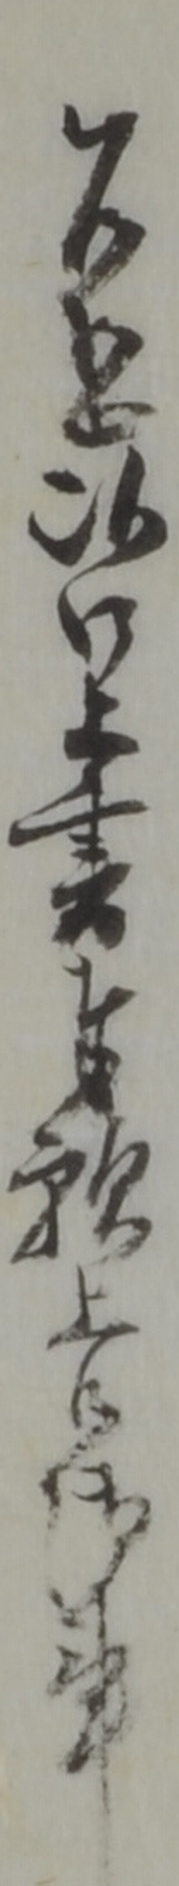乍恐以口上書奉願上候御事
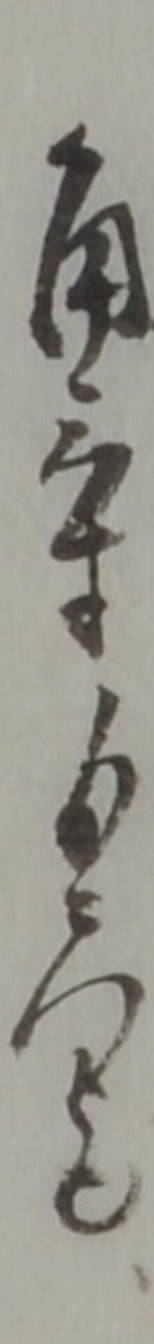角三寸ゟ尺迄
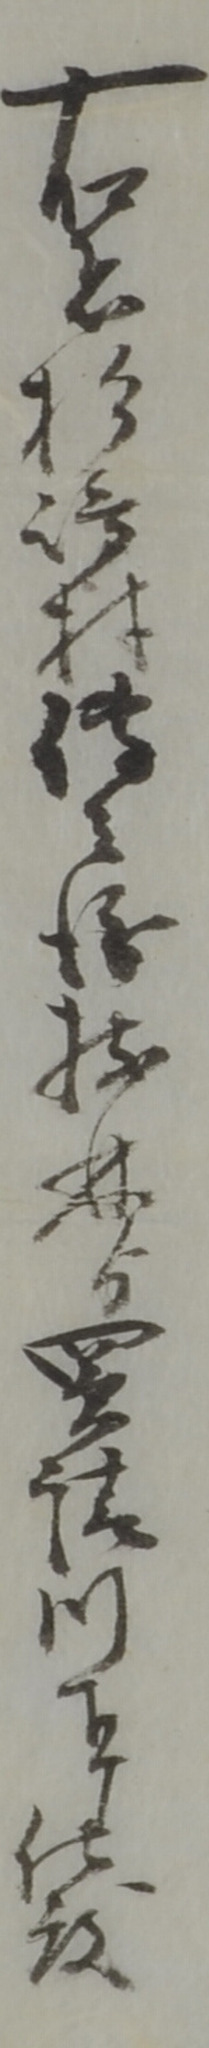右者松嶋村伝兵衛持林ゟ買請川下ヶ仕度
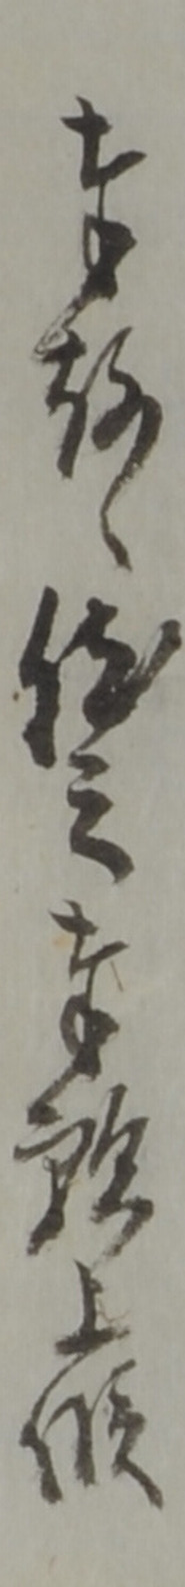奉存候依之奉願上候
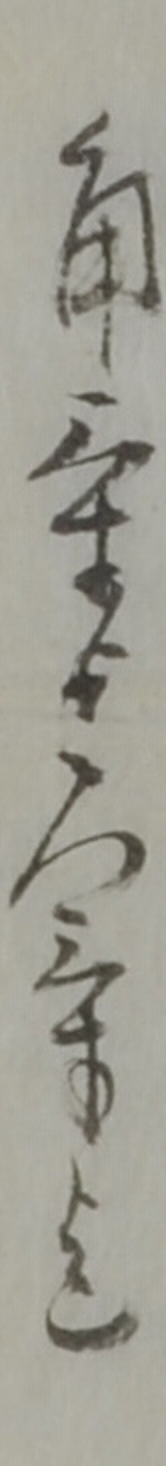角三寸ゟ尺三寸迄
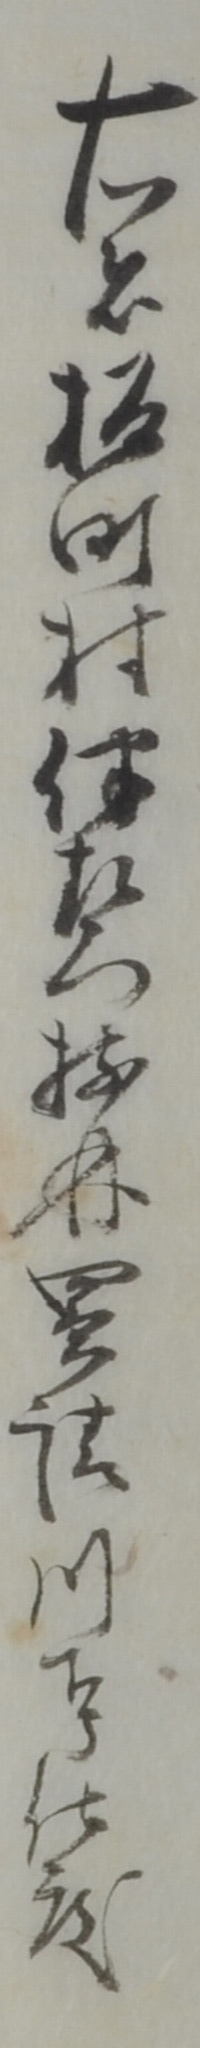右者板町村伴左衛門持林買請川下ヶ仕度

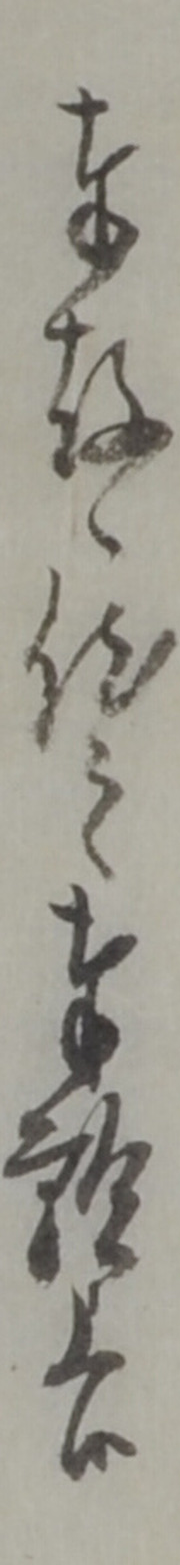奉存候依之奉願上候
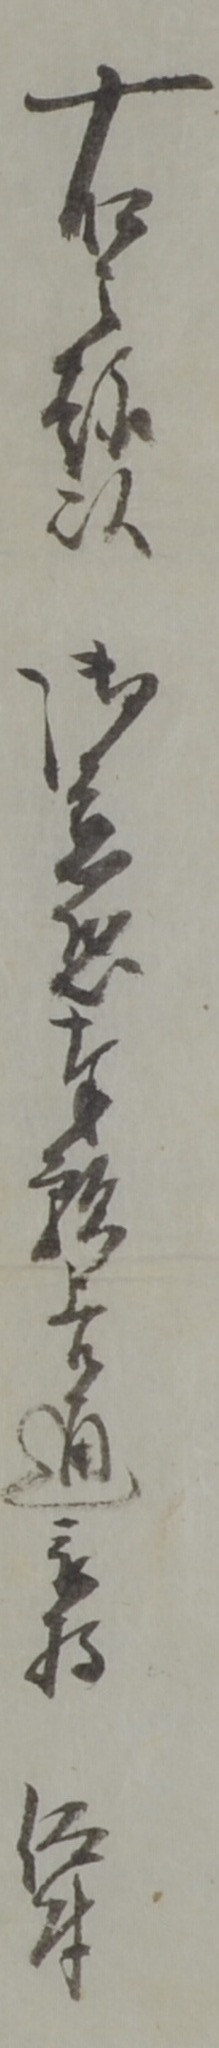右之趣以御慈悲奉願上候通被為仰付
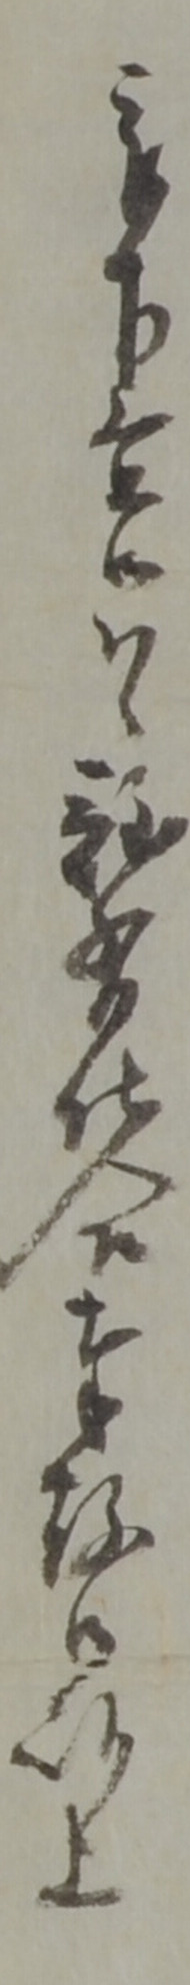被下置候ハヽ難有仕合奉存候以上
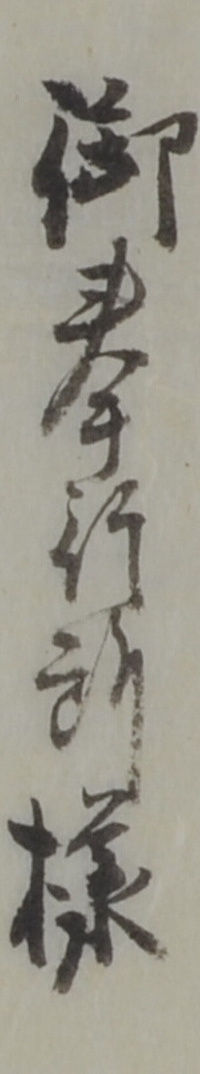御奉行所様
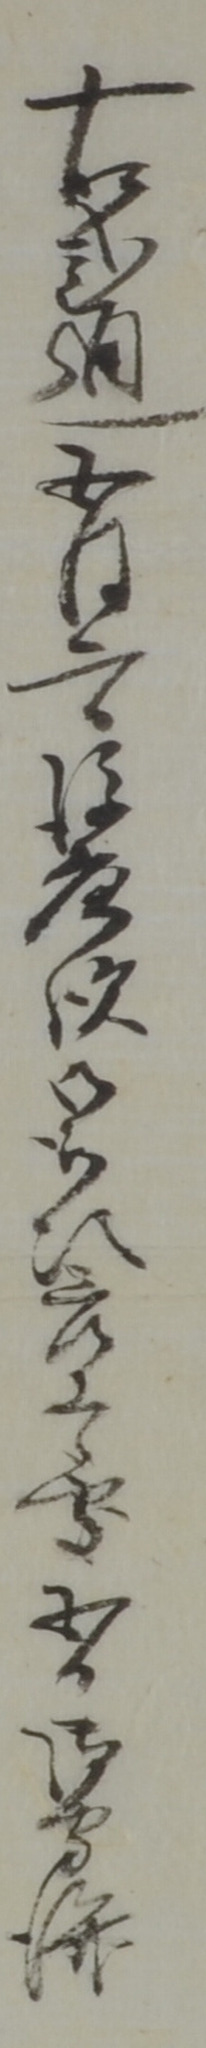右弐通五月二日後藤様御取次差上候處五日御聞済
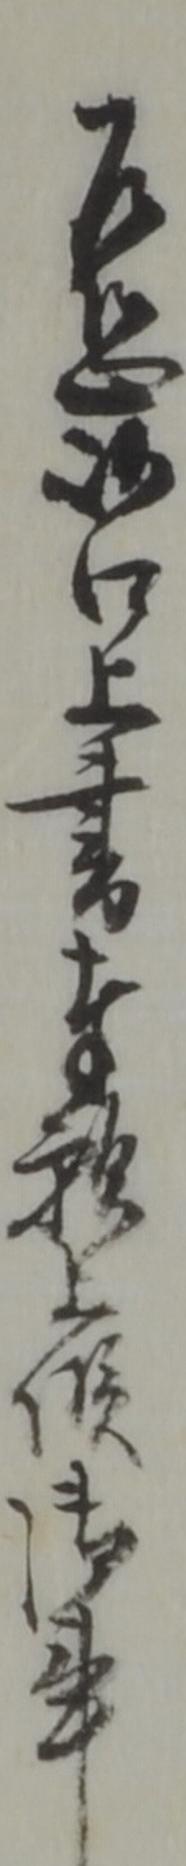乍恐以口上書奉願上候御事
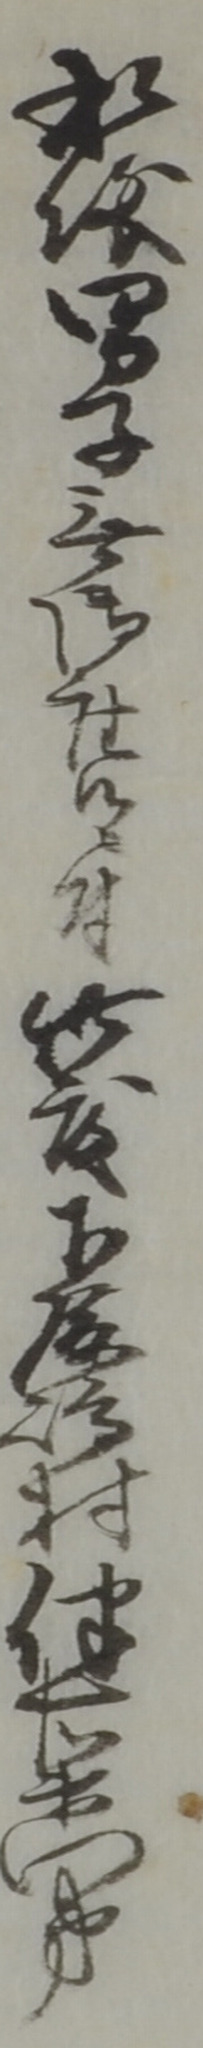私儀男子無御座候ニ付此度下殿嶋村伴右衛門弟
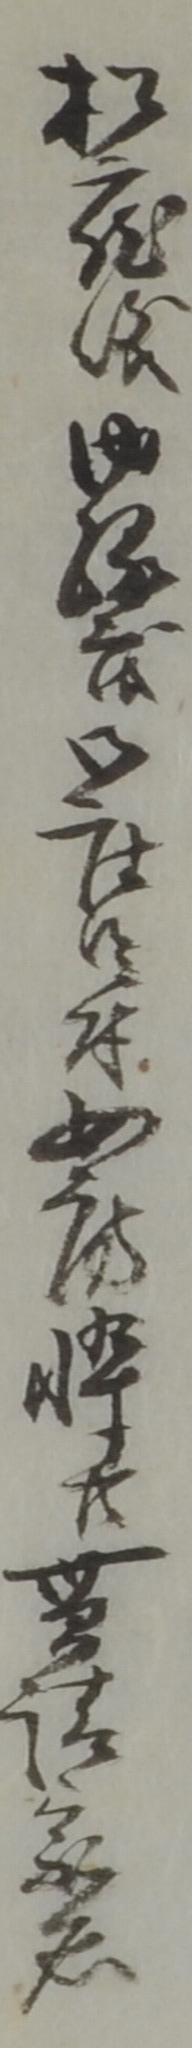松蔵儀内縁茂御座候ニ付女房忰共貰請家名
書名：諸願書控簿
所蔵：伊那市立高遠町図書館・合同会社AMANE
